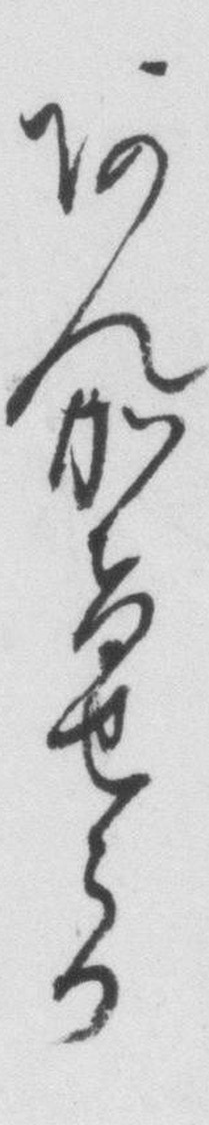あんかるせうか
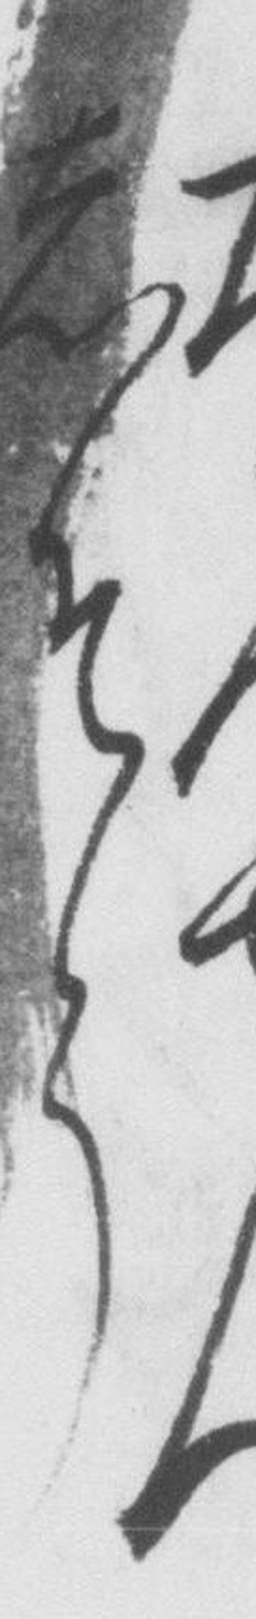ゑそう
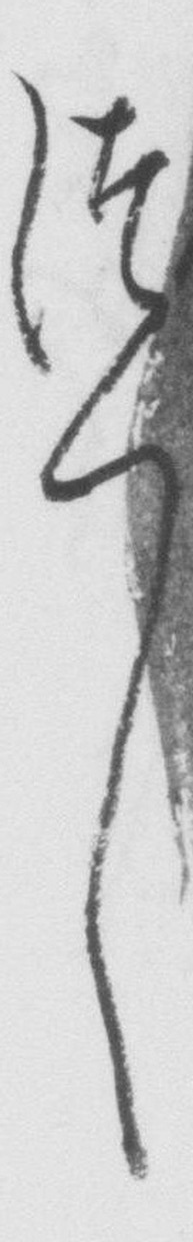つくし
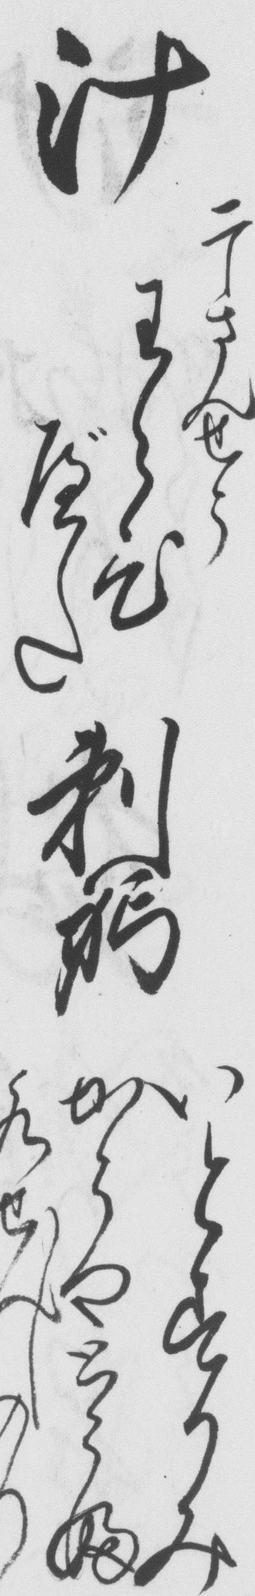汁わらひ刺躬かうやとうふ
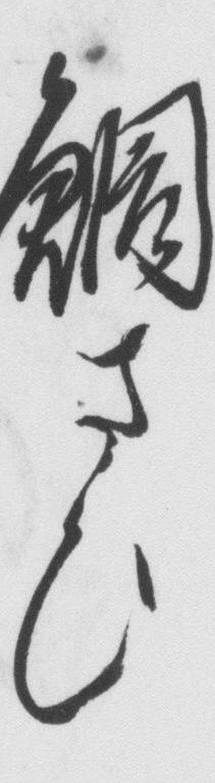鯛さひ
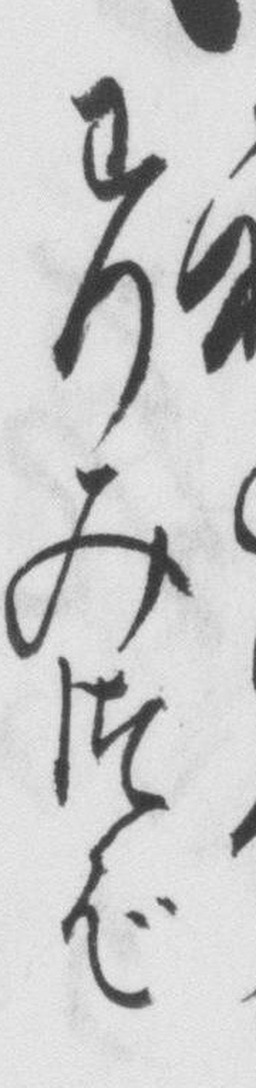すりみつば
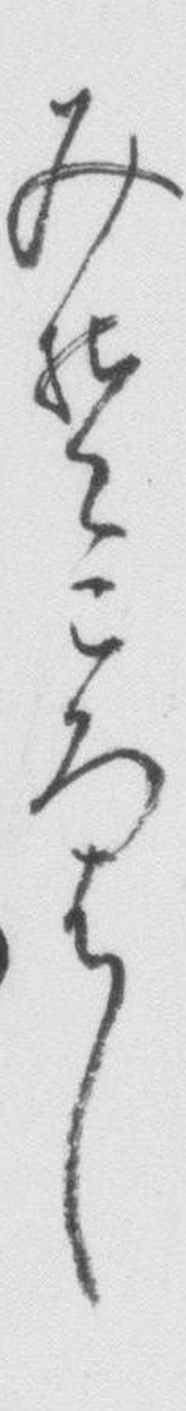みそころはし

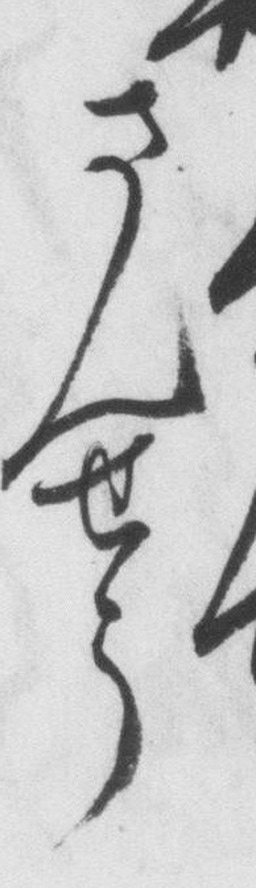さんせう
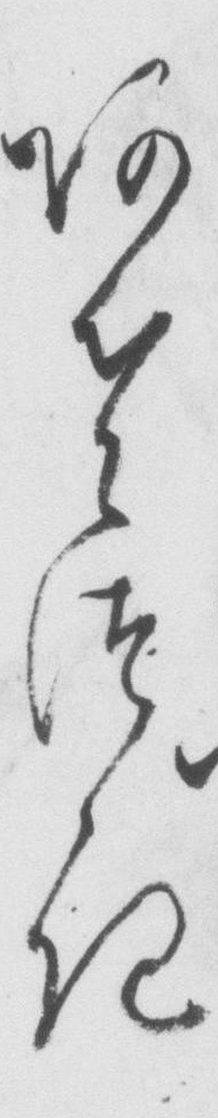あさつき
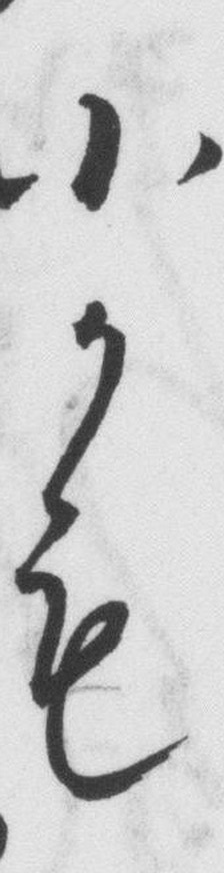小かも
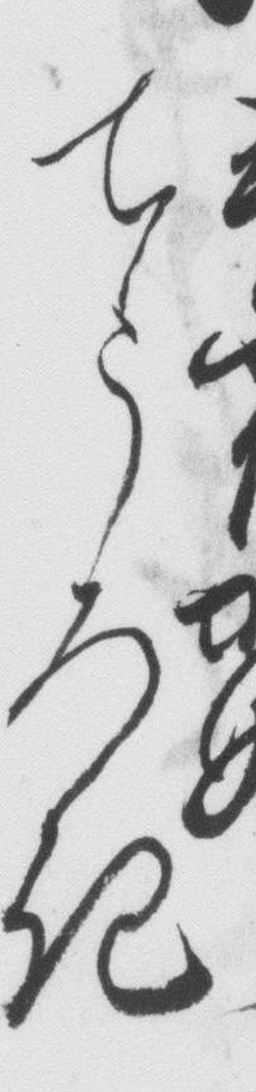てうろき
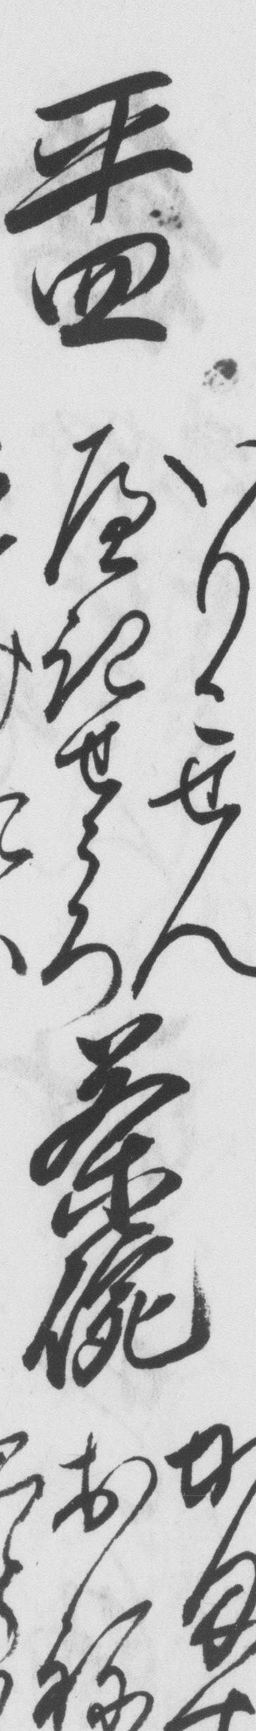平皿へきせうろ茶碗ねば

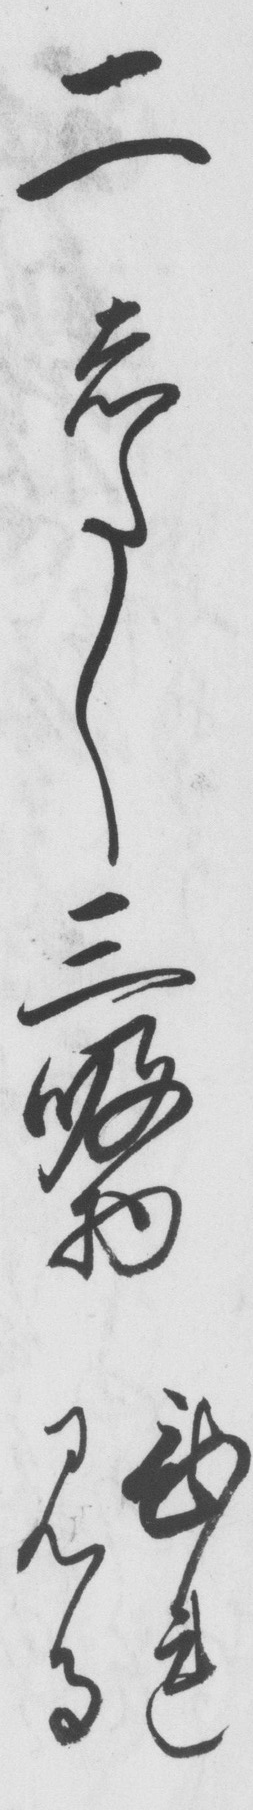二したし三吸物けれ
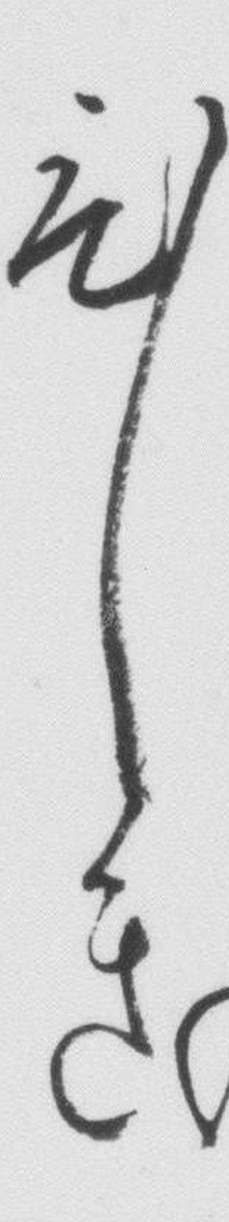ひしき
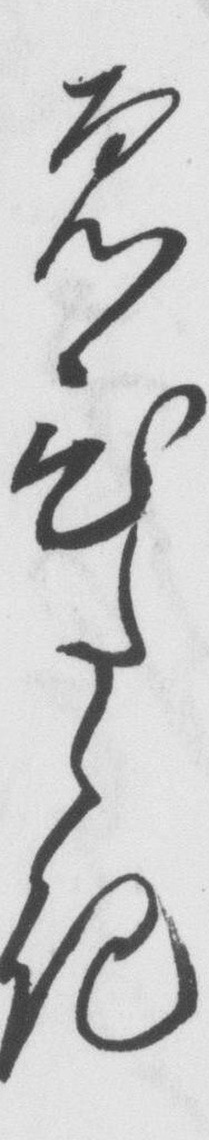ゑひたゝき
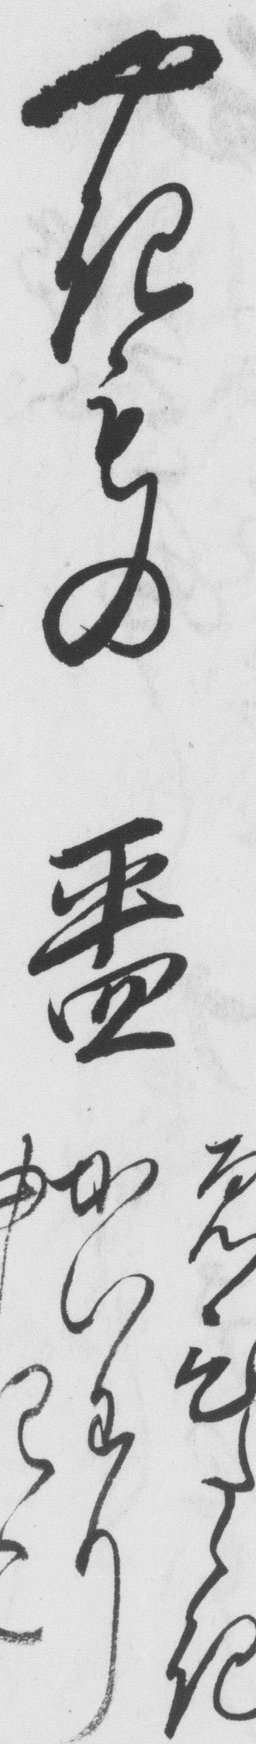やきもの平皿かいわり
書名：料理筌
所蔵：大阪府立大学学術情報センター 国文学研究資料館
